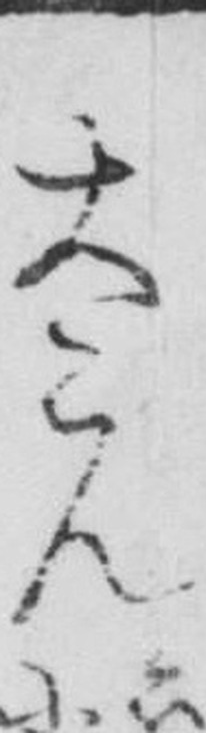大こん
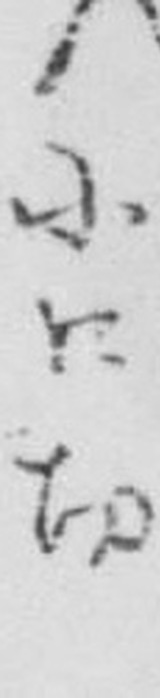小口切
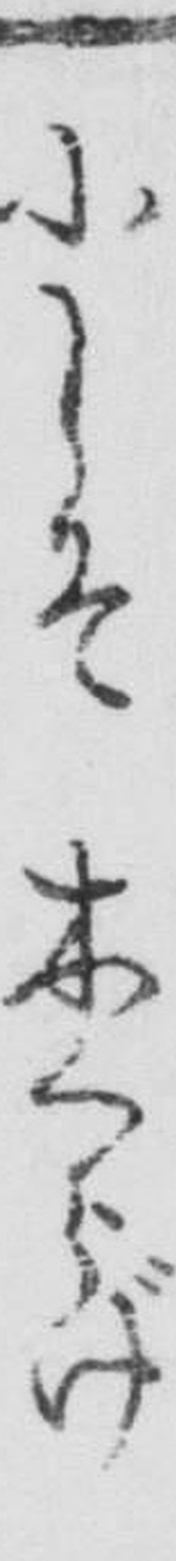小しそ木くらげ
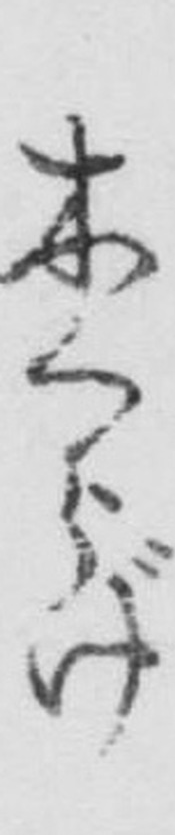木くらげ
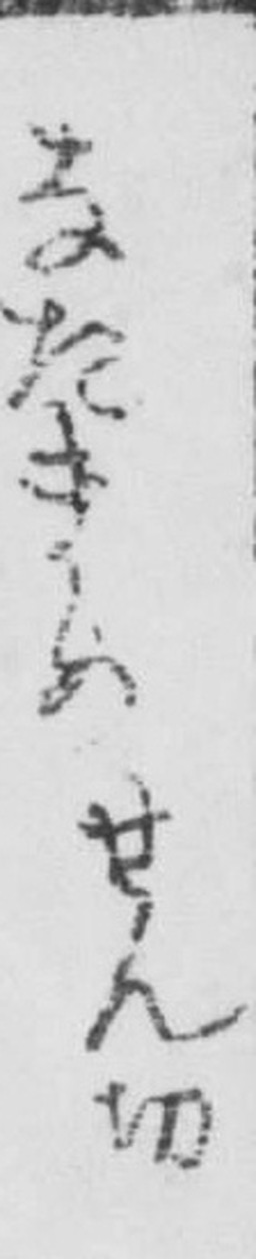なたまめせん切
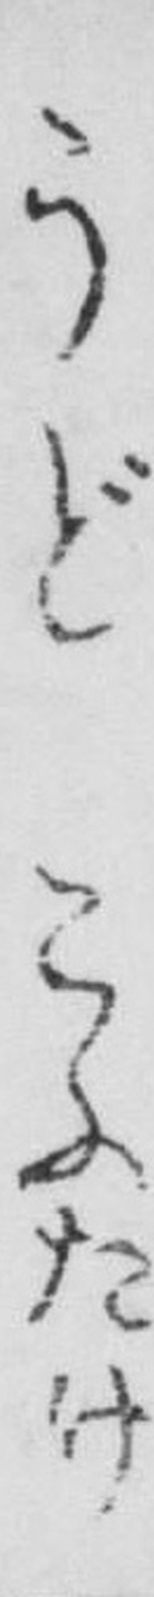うどこふたけ
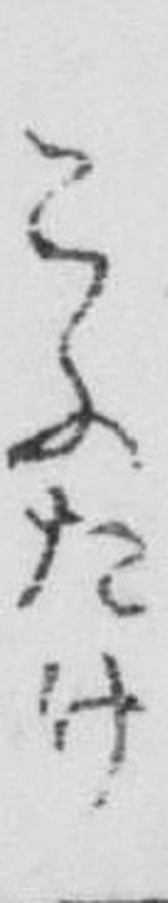こふたけ
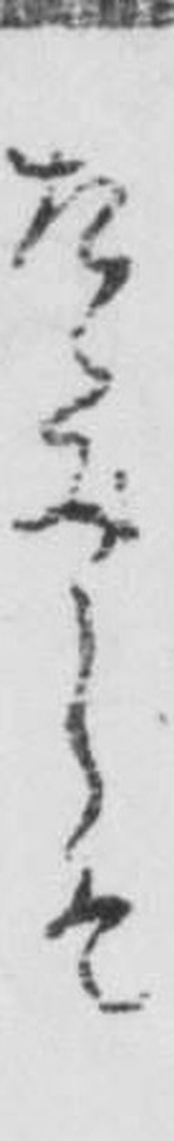たゝみしそ
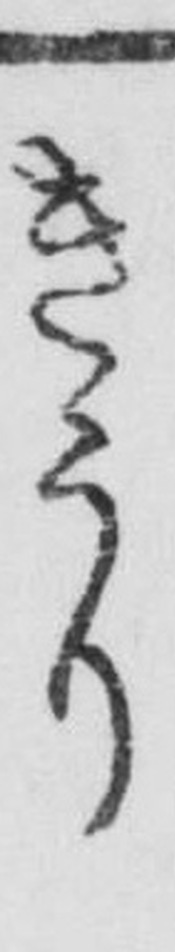きうり
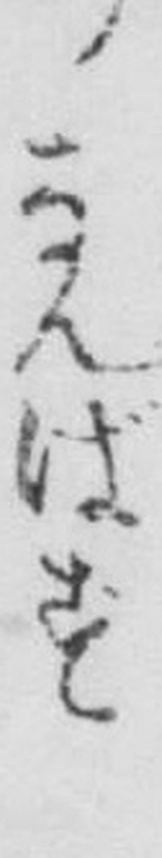なんばず
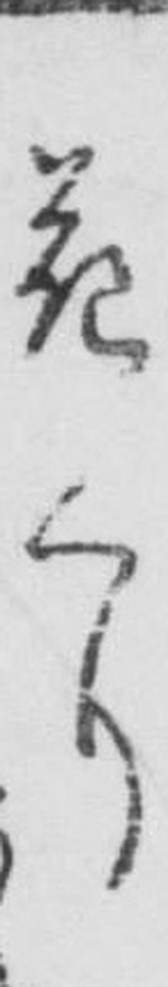花くり
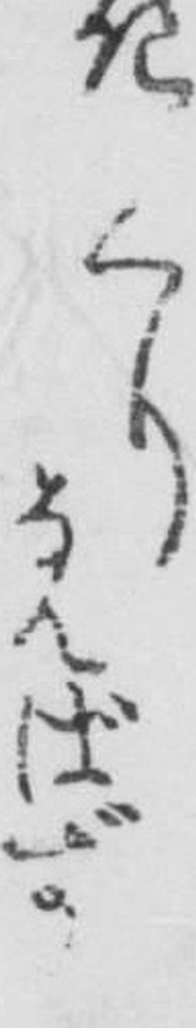なんばず
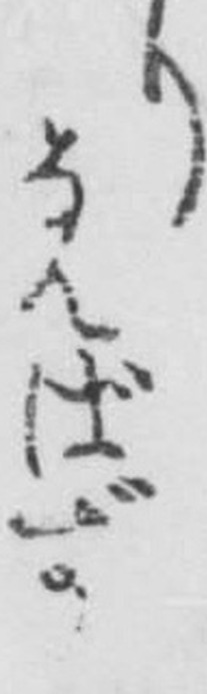なんばず
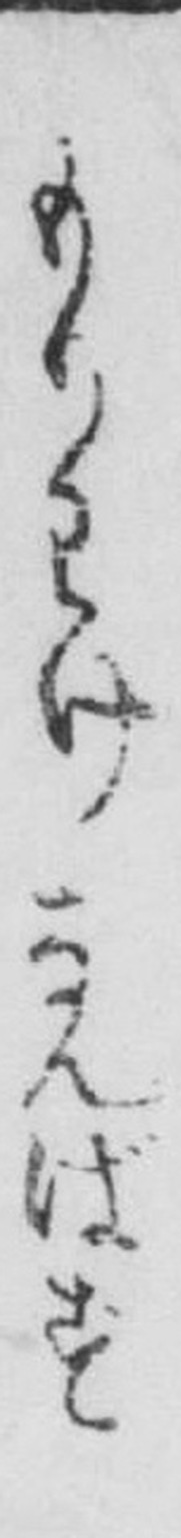もりわけなんばす
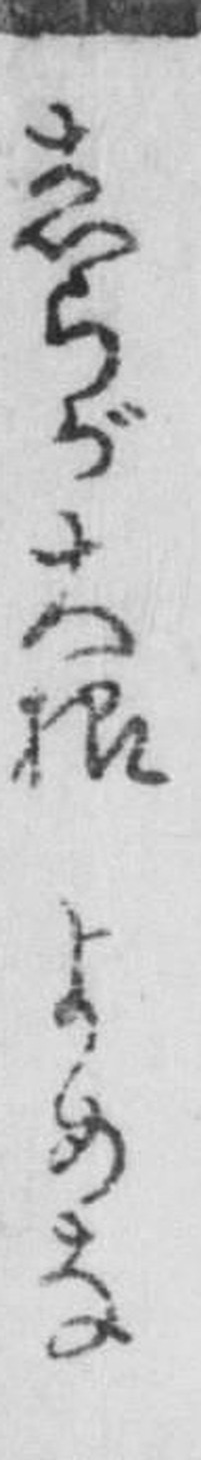しらが大根よめな
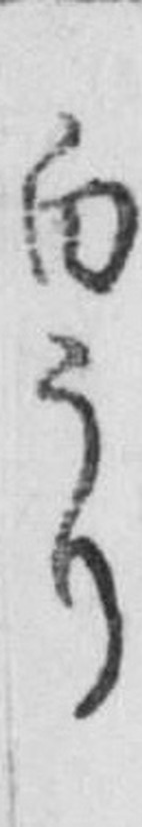きうり
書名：諸家通用/即席料理
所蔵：大阪府立大学学術情報センター 国文学研究資料館
